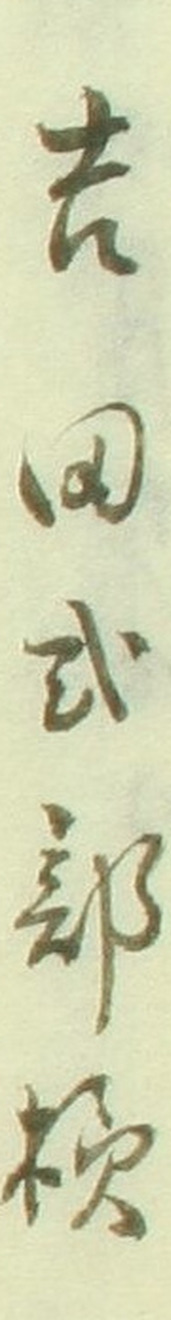吉田式部様
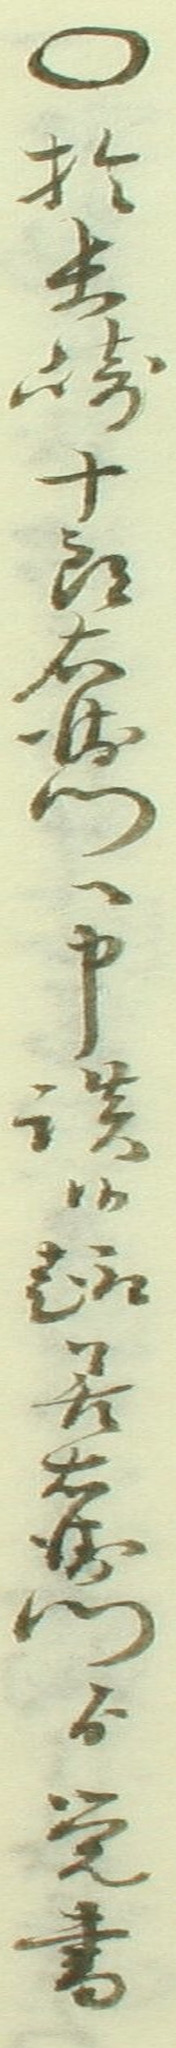〇於長崎十郎右衛門へ申談候趣善右衛門ゟ覚書
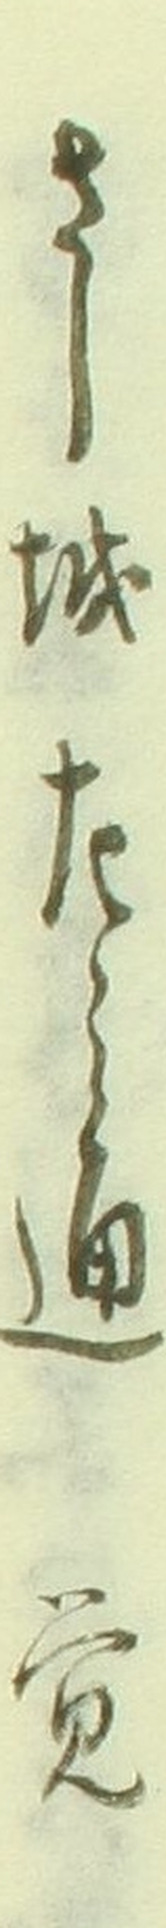さし越左之通覚
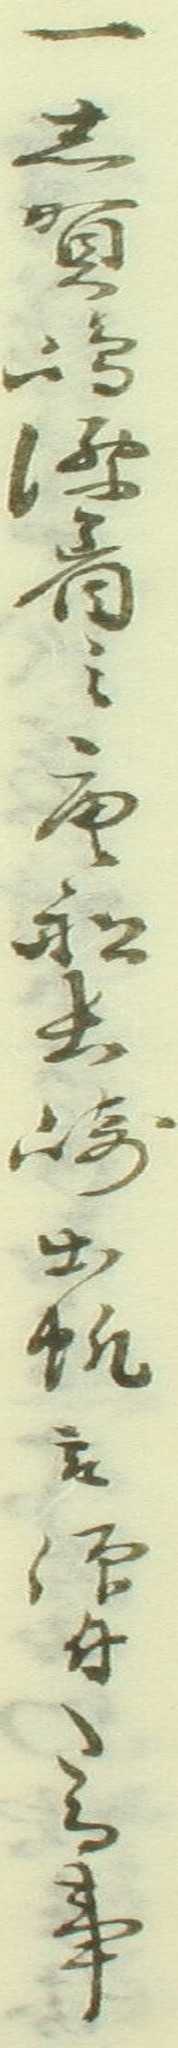一志賀島漂着之唐船長崎出帆被仰付たる事
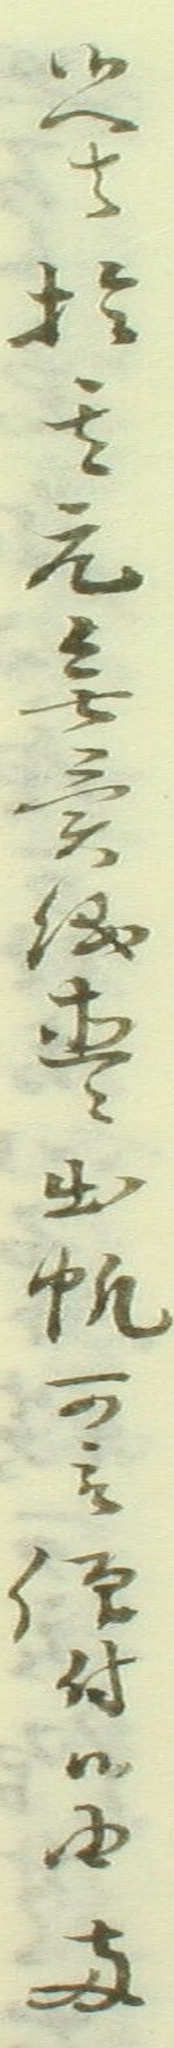候へは於其元無異儀直々出帆可被仰付候由両
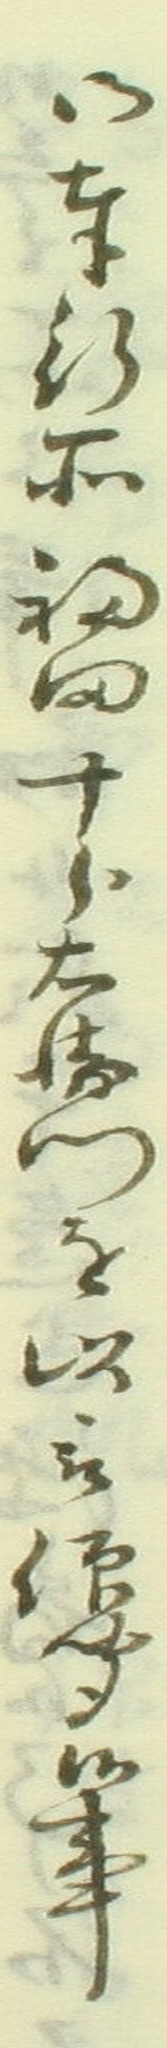御奉行所福田十郎右衛門を以被仰聞候事
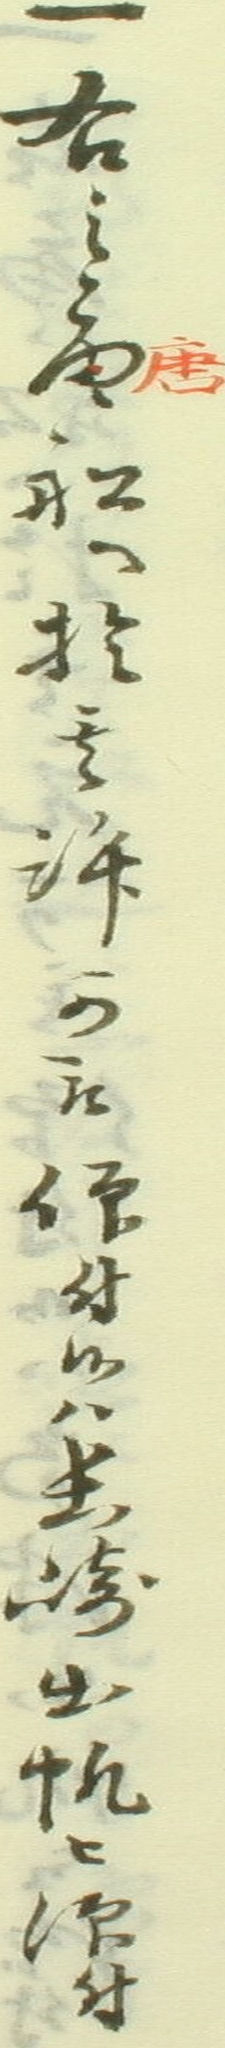一右之唐船へ於其許可被仰付候は長崎出帆被仰付
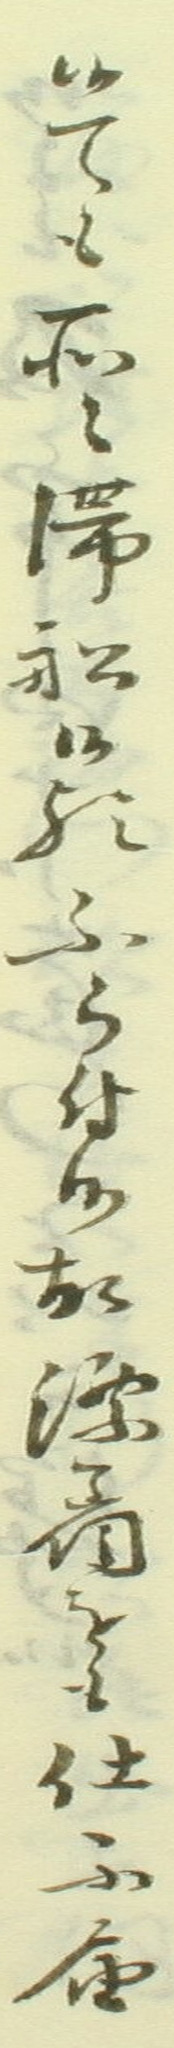候ても所々滞船候歟ふら付候故漂着をも仕不届
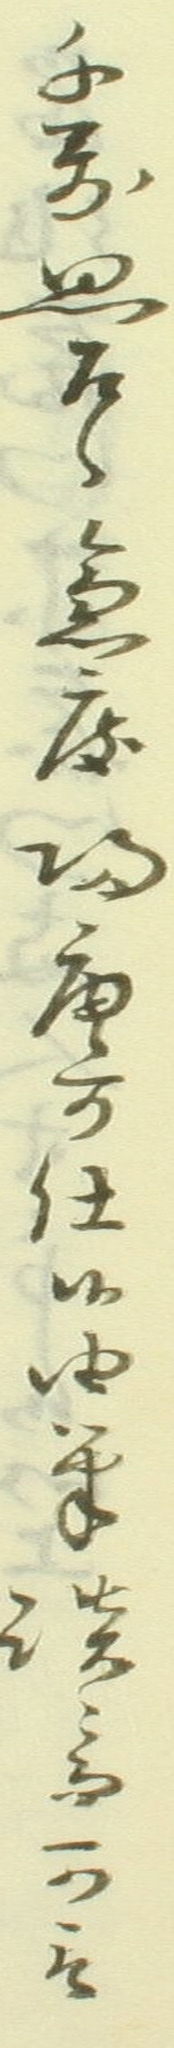千万思召候急度帰唐可仕候由筆談に而可被
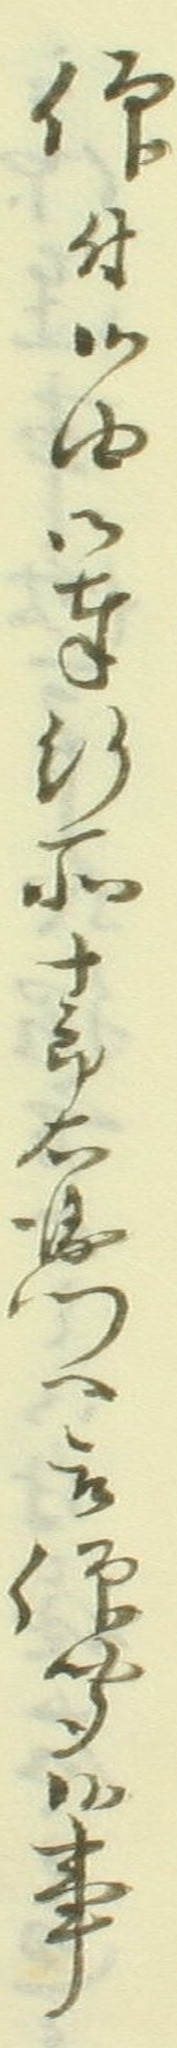仰付候由御奉行所十郎右衛門へ被仰聞候事
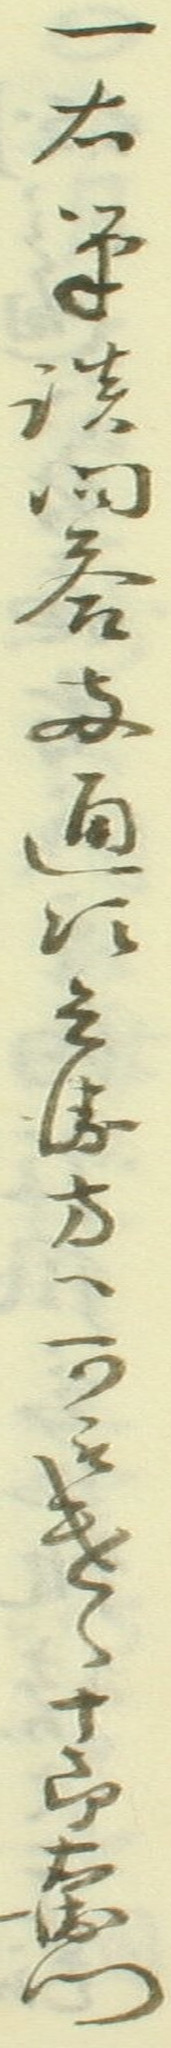一右筆談問答両通次兵衛方へ可被遣候十郎右衛門
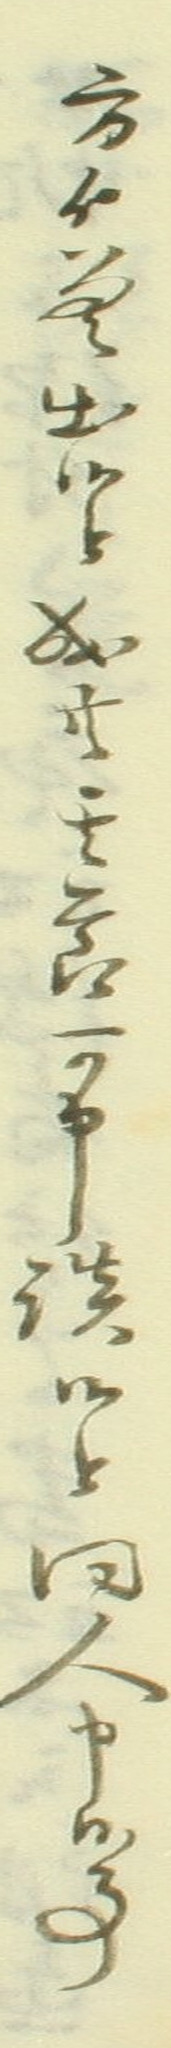方ゟ差出候と成共其節可申談候と同人申候事
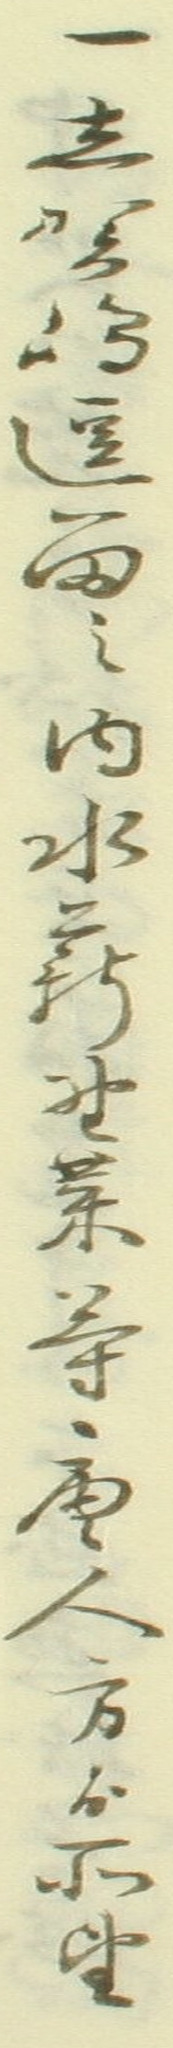一志賀島逗留之内水薪野菜等唐人方ゟ所望
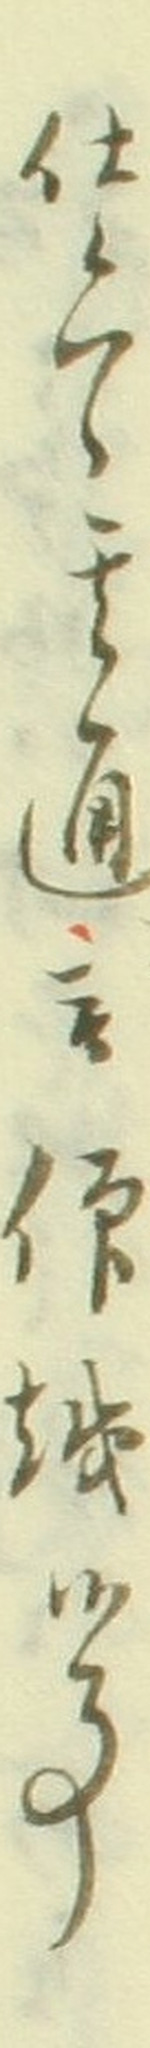仕候はゝ其通被仰越候事
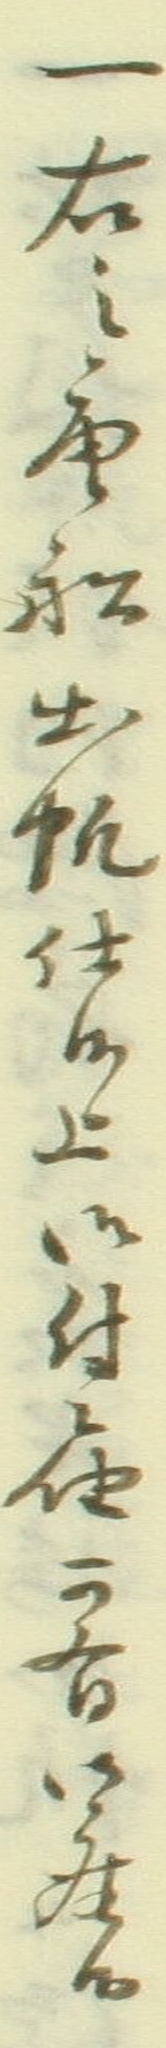一右之唐船出帆仕候上御付届可有御座候
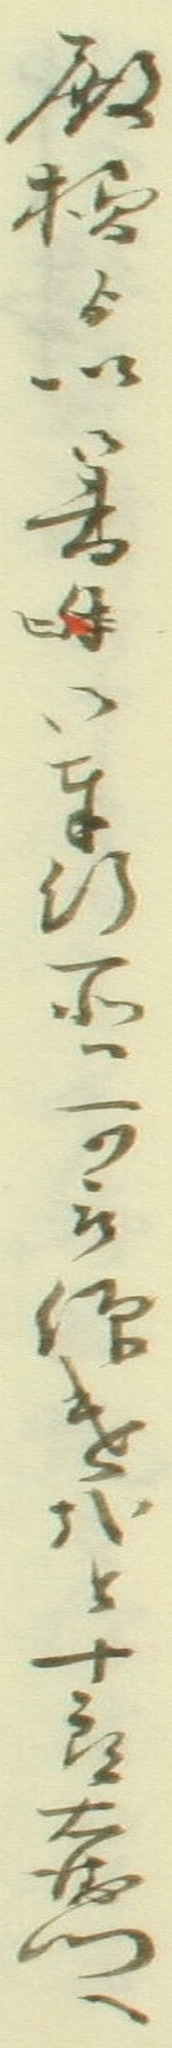殿様ゟ以御書付御奉行所へ可被仰遣哉と十郎右衛門へ
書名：異国船漂着記
